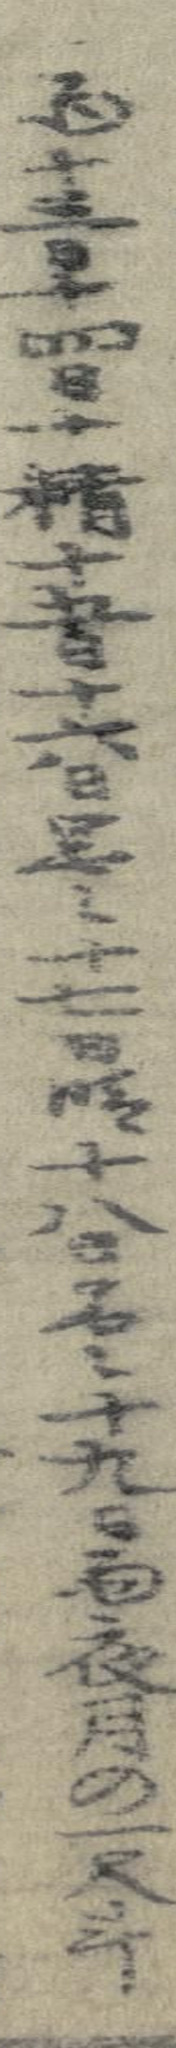雨十三日十四日十精十五日十六日曇十七日晴十八日曇十九日雨夜月の一尺計
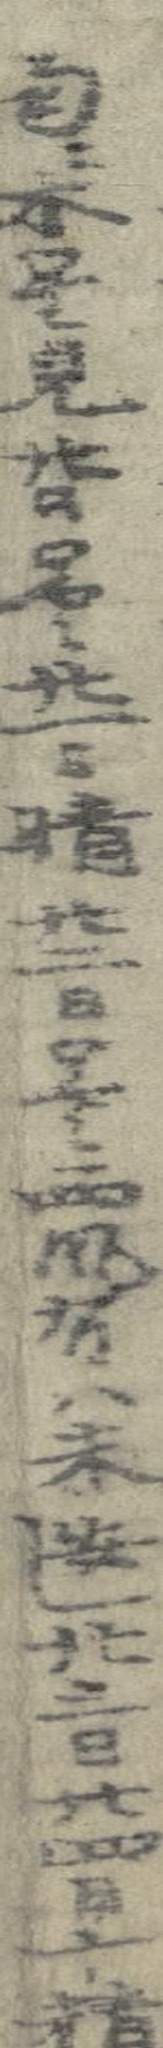南に木星見廿日曇廿一日晴廿ニ日曇西風有は末安し廿三日廿四日十精
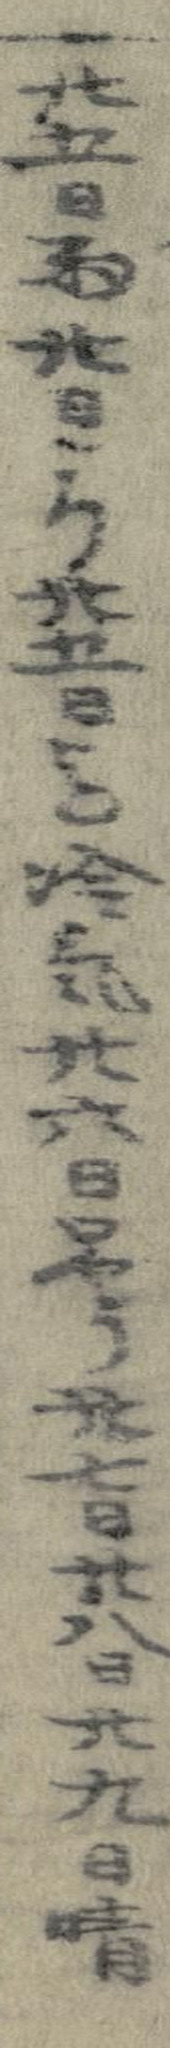廿五日雨廿日より廿五日迄冷気廿六日曇廿七日廿八日廿九日晴
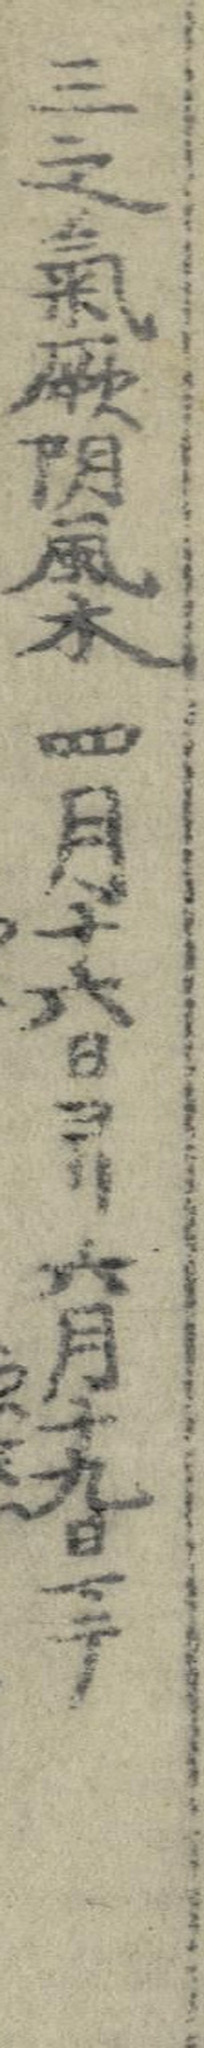三之気厥陽風木四月十六日ヨリ六月十九日マテ
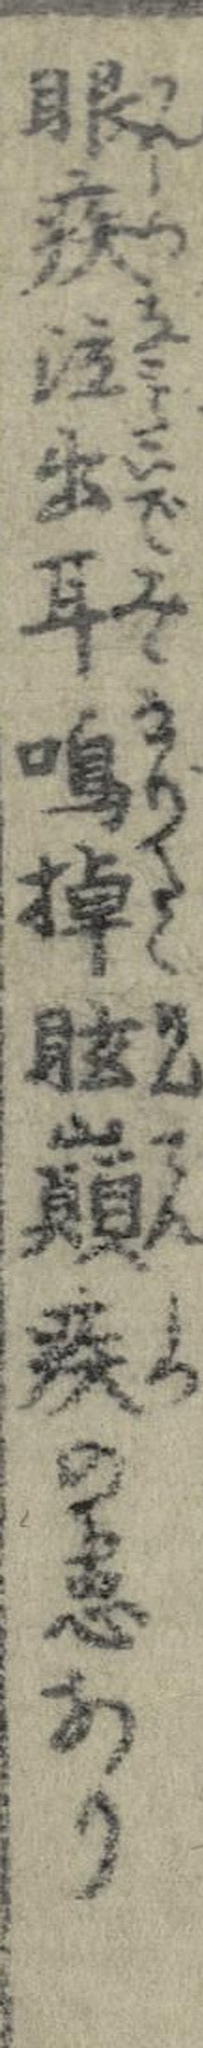眼疾泣出耳鳴掉眩巓疾の患あり
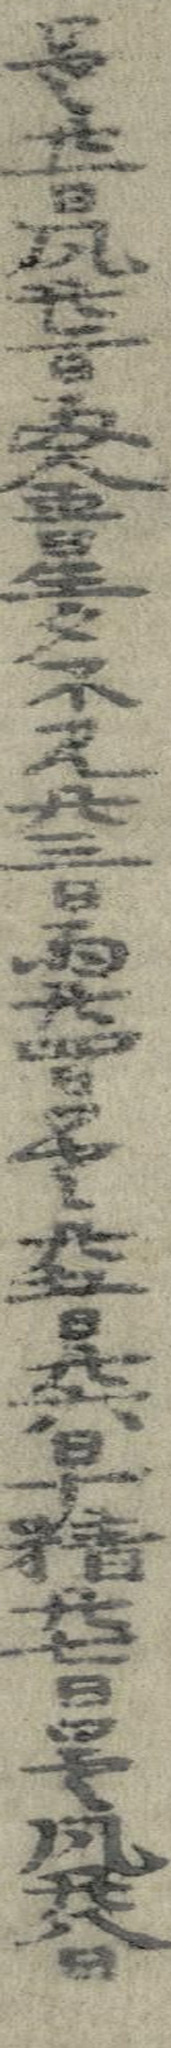曇廿一日風廿ニ日雨金星夕不見廿三日雨廿四日曇廿五日廿六日十精廿七日曇風廿八日
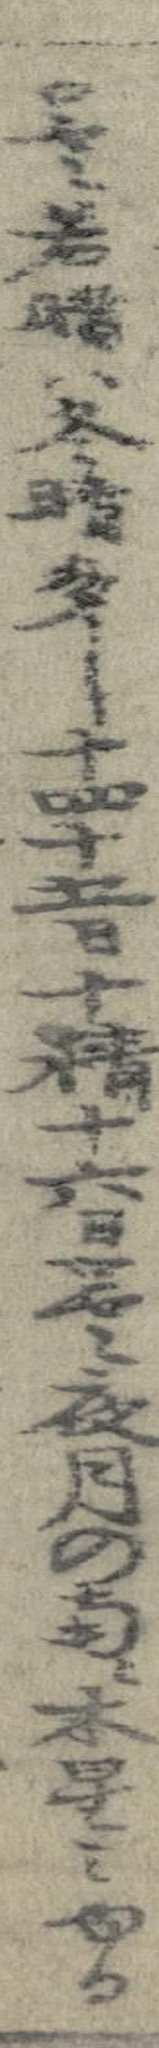曇若晴は冬晴多し十四日十五日十精十六日曇夜月の南に木星みゆる
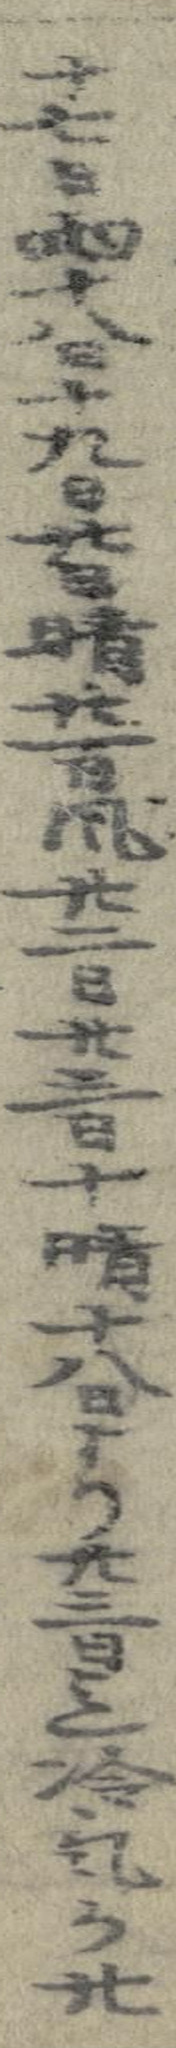十七日雨十八日十九日廿日晴廿一日風廿ニ日廿三日十精十八日より廿三日迄冷気か廿
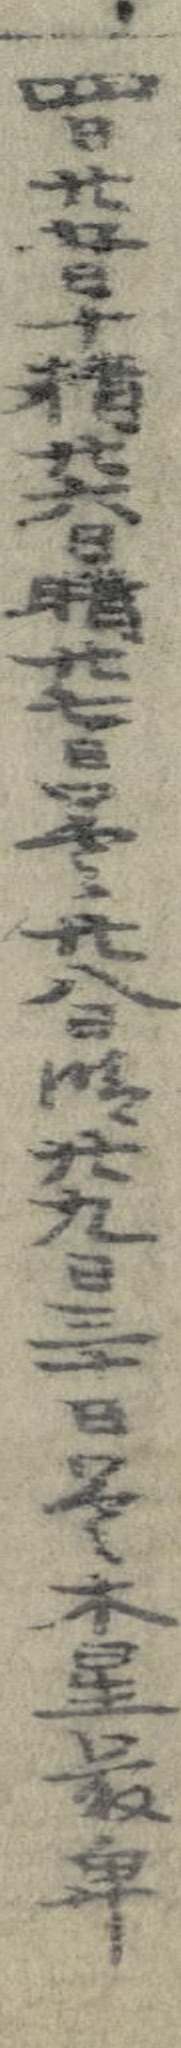四日廿五日十精廿六日晴廿七日曇廿八日晴廿九日三十日曇木星最卑
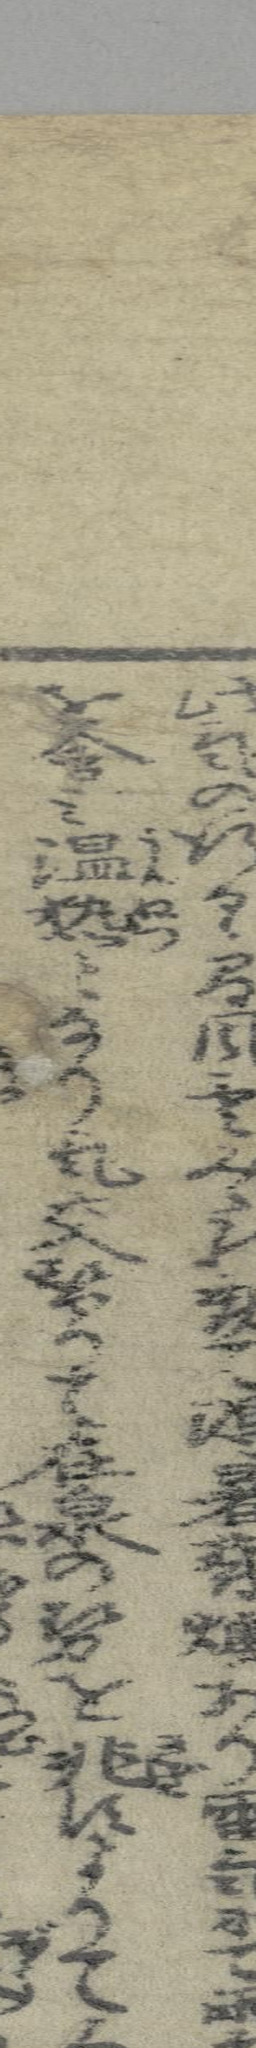を含み温熱となり気は入替つて在泉の勢を兆すよりて白
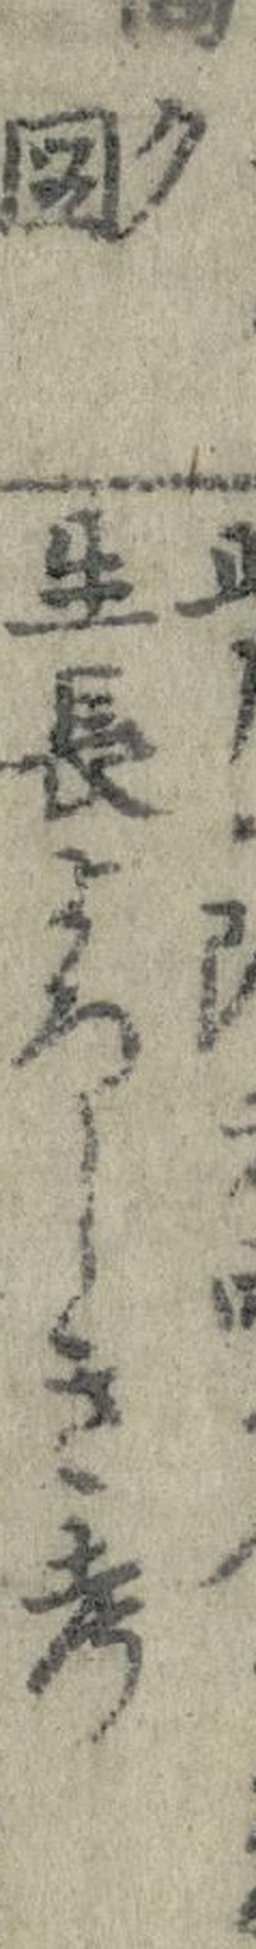如図生長よろしき考
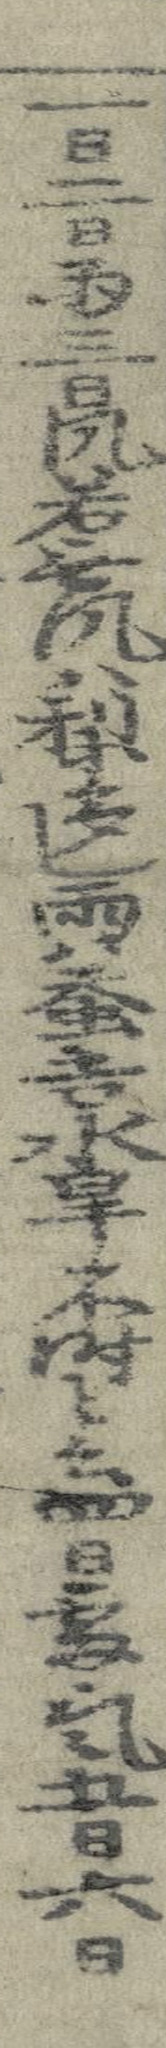一日二日雨三日風若無風は穀多し雨は蚕吉水旱不時を云四日雪気五日六日
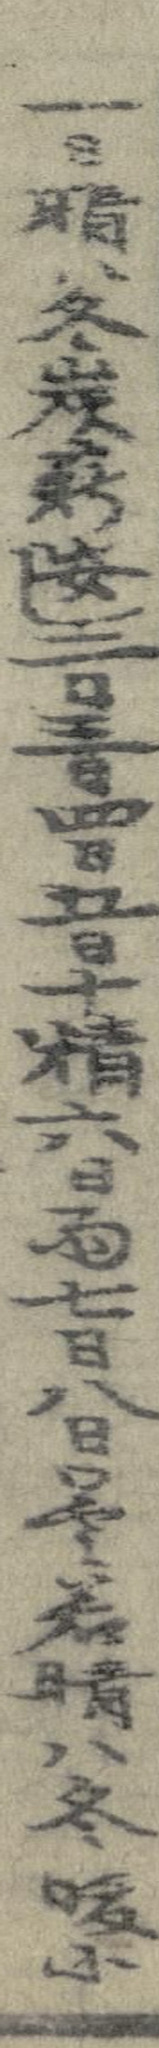一日晴は冬炭薪安し二日三日四日五日十精六日雨七日八日曇若晴は冬暖に
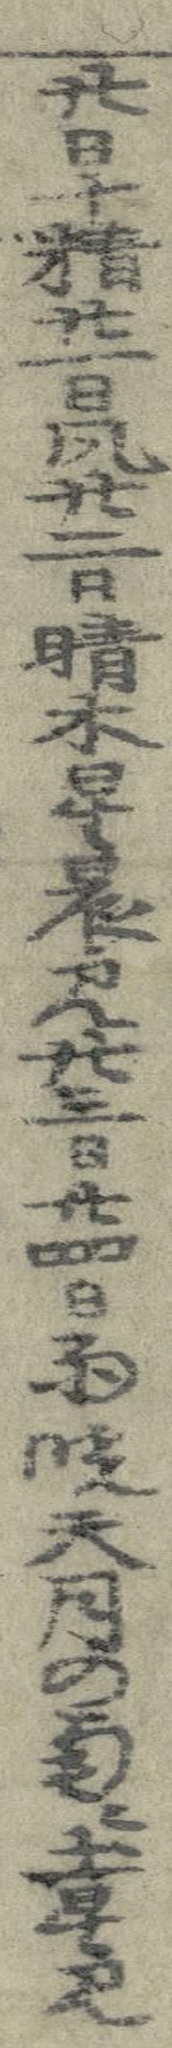廿日十精廿一日風廿二日晴木星晨見廿三日廿四日雨暁天月の南土星見
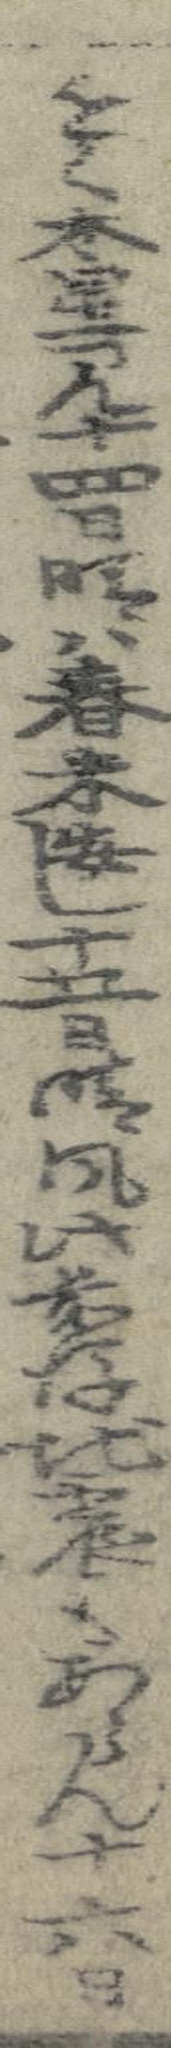遠く木星見十四日晴は春米安し十五日晴風此前後地震もあらん十六日
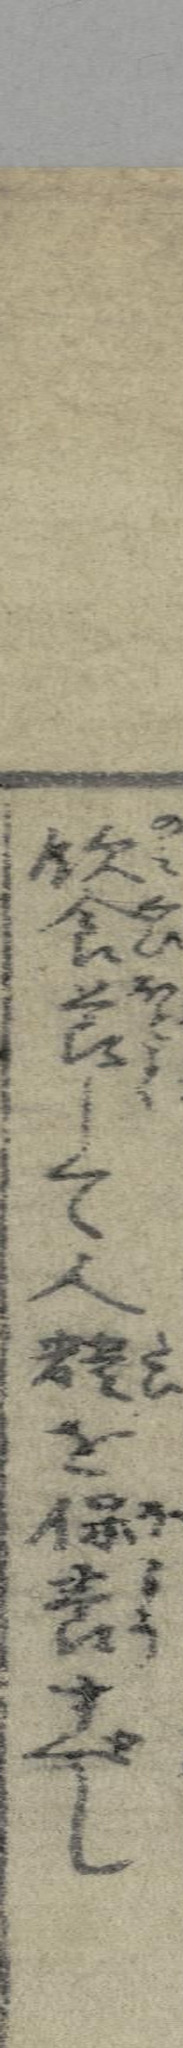飲食節して人體を保養すべし
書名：天保十六年乙巳七曜　晴雨考　土御門殿御免
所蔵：東京大学地震研究所図書室 Earthquake Research Institute Library, The University of Tokyo, JAPAN
